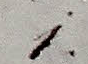1
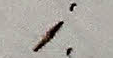1.
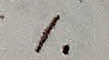1.
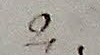2
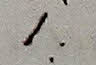1.
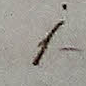1
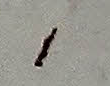1
